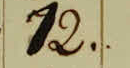72.
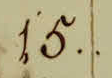15.
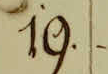19.
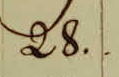28.
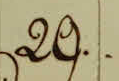29.
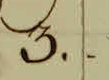3.
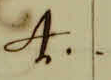4.
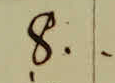8.
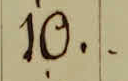10.
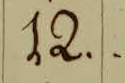12.
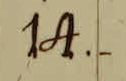14.
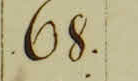68.
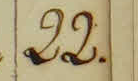22.
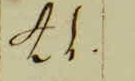41.
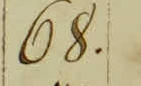68.
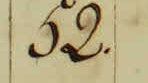52.
